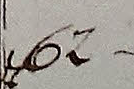62
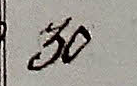30
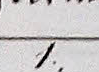1.
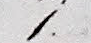1.
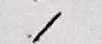1
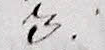3.
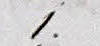1.
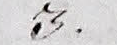3.
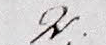2
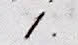1
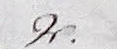2.
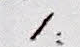1
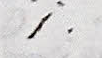1.
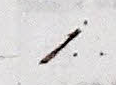1.
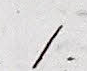1
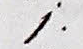1
